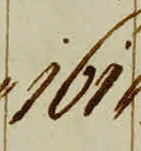161
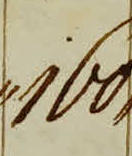160
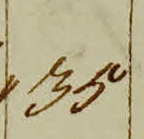35
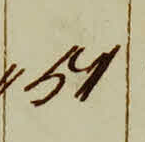51
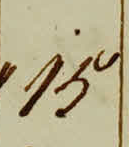15
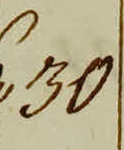30
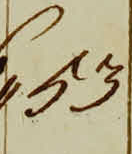53
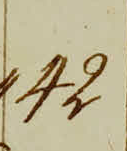42
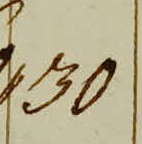30
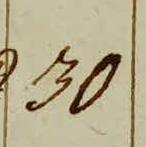30
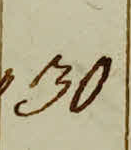30
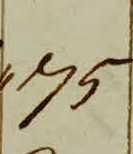75
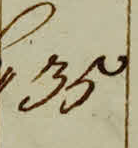35
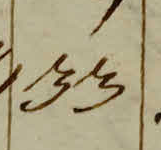33
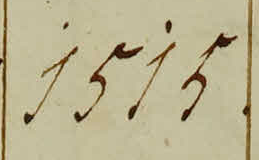1515
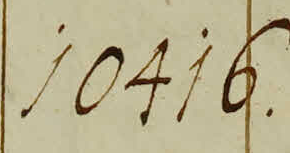10416
